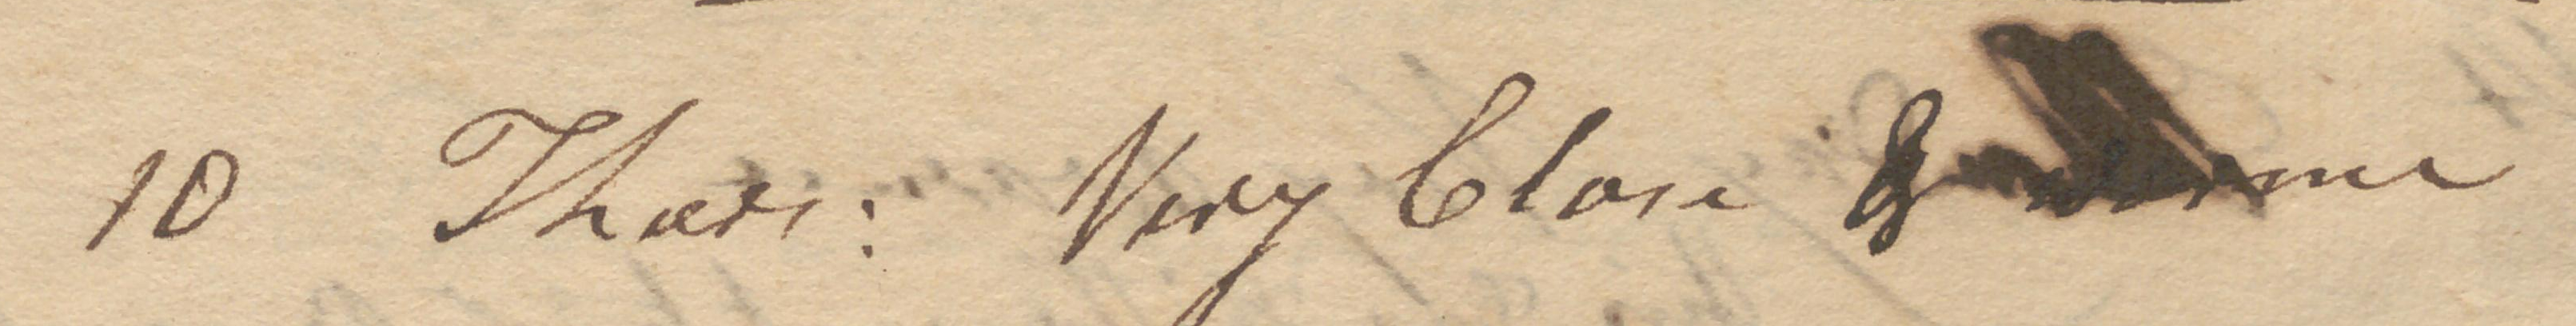10 Thurs. Very Close & warm
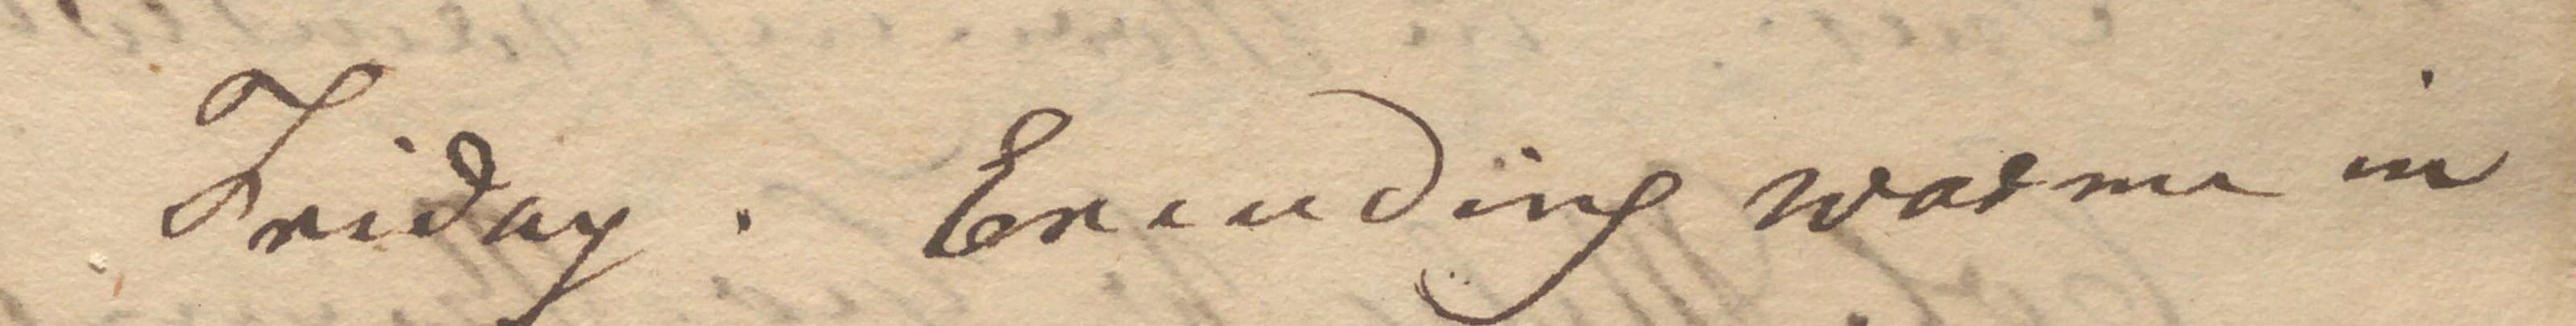Friday. Exceeding warme in
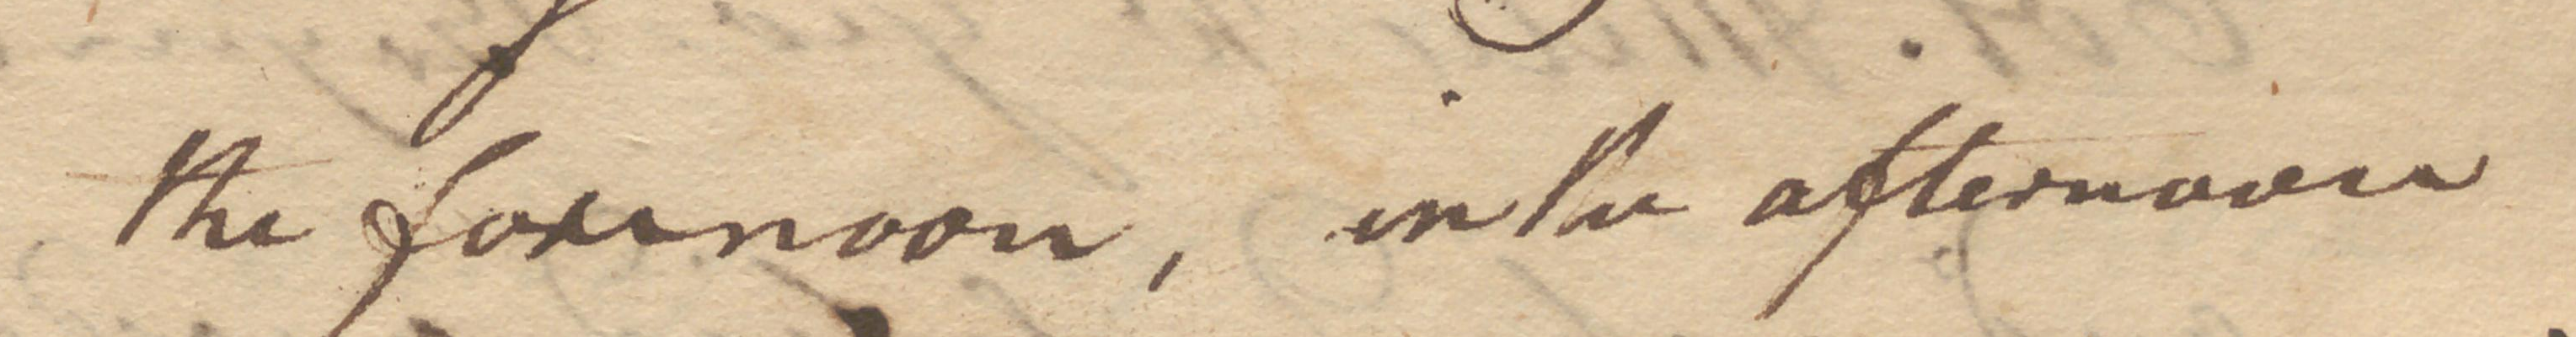the forenoon, in the afternoon
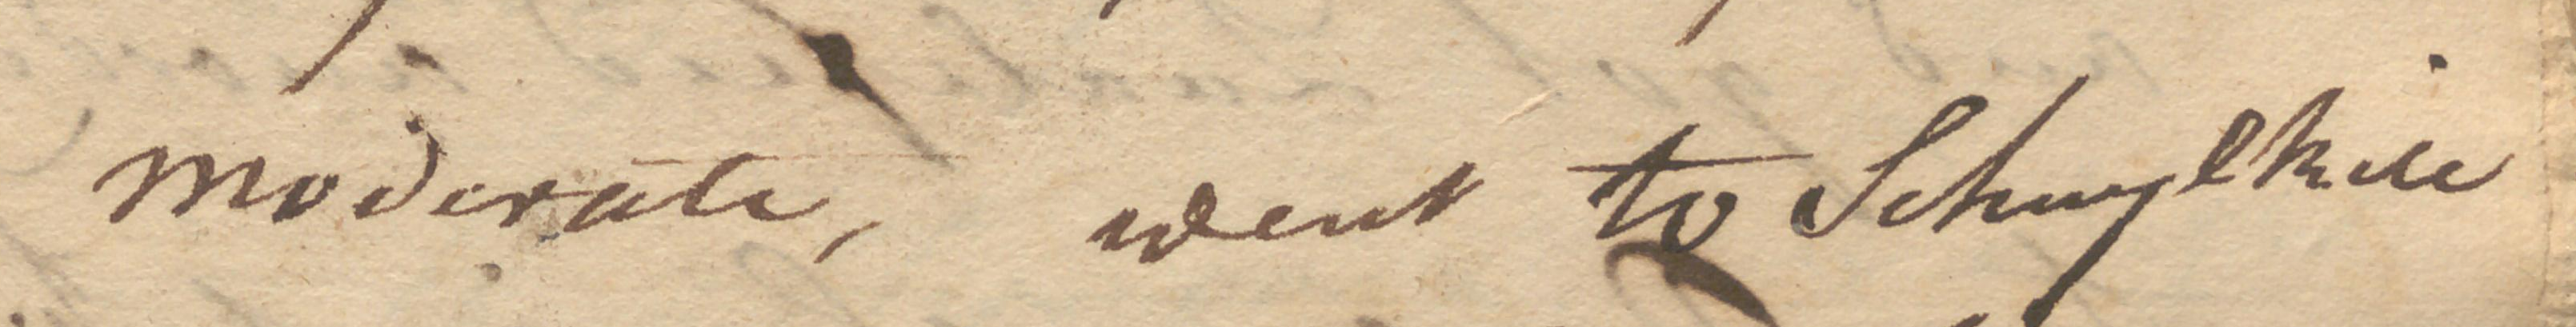moderate, went to Schuylkill
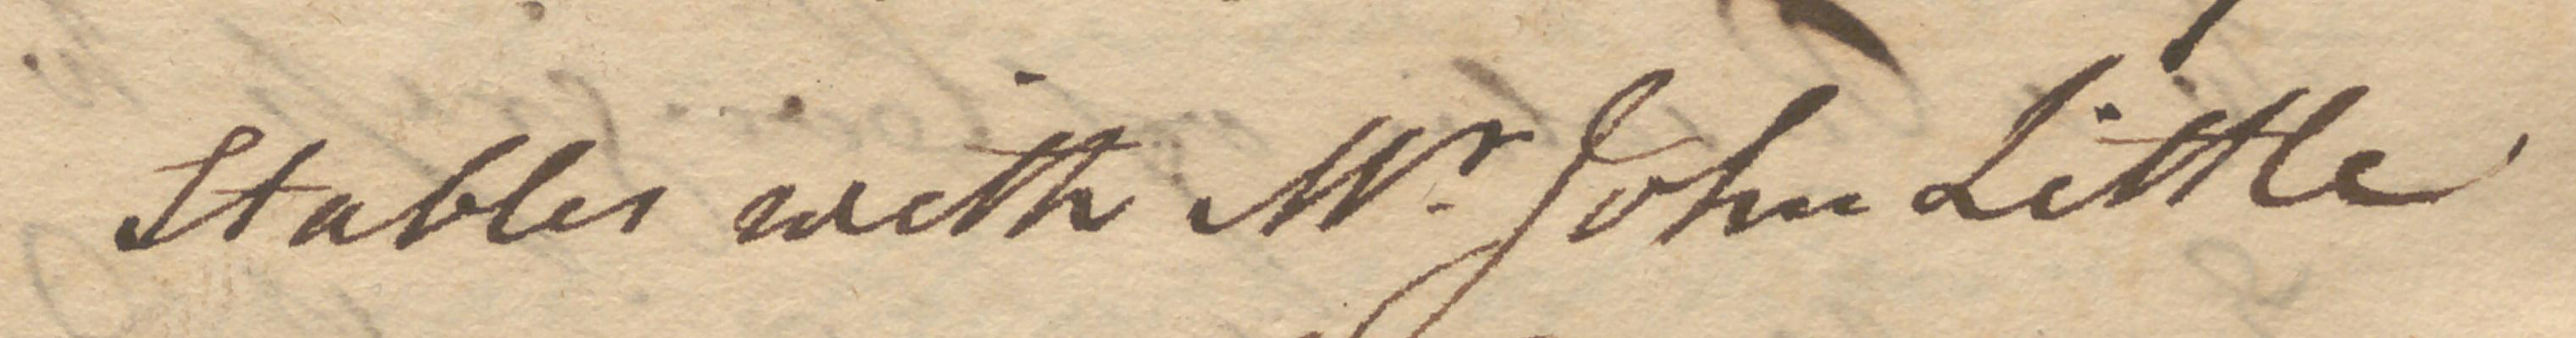Stables with M^r. John Little
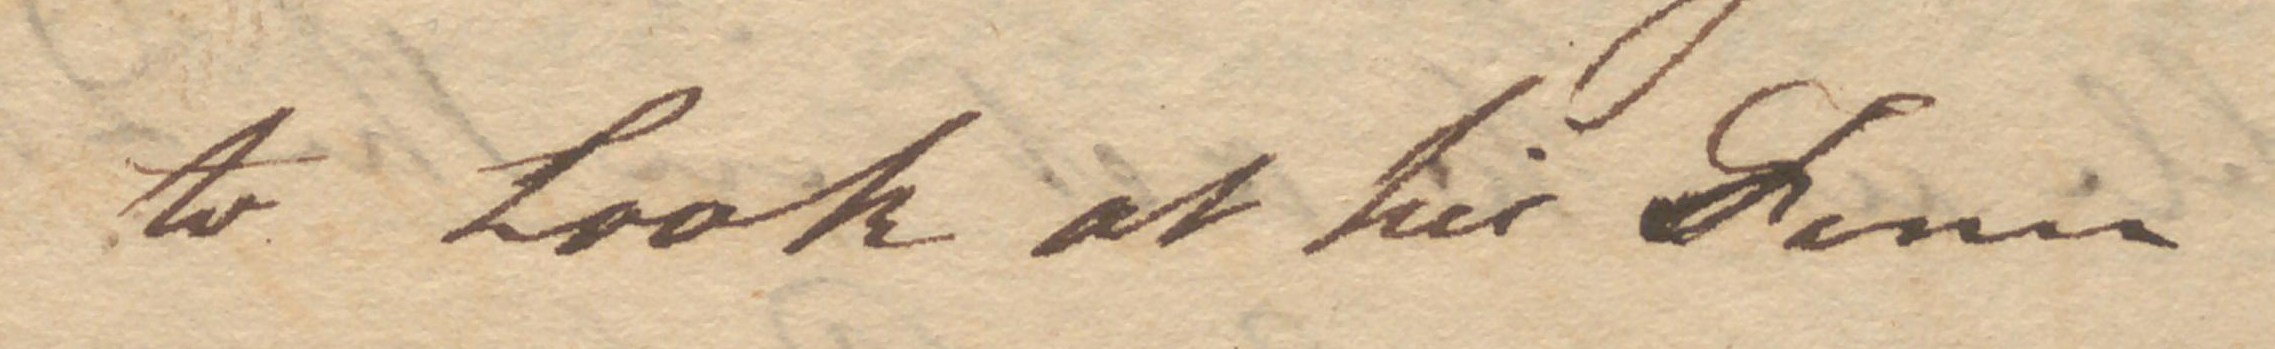to Look at his Fence
